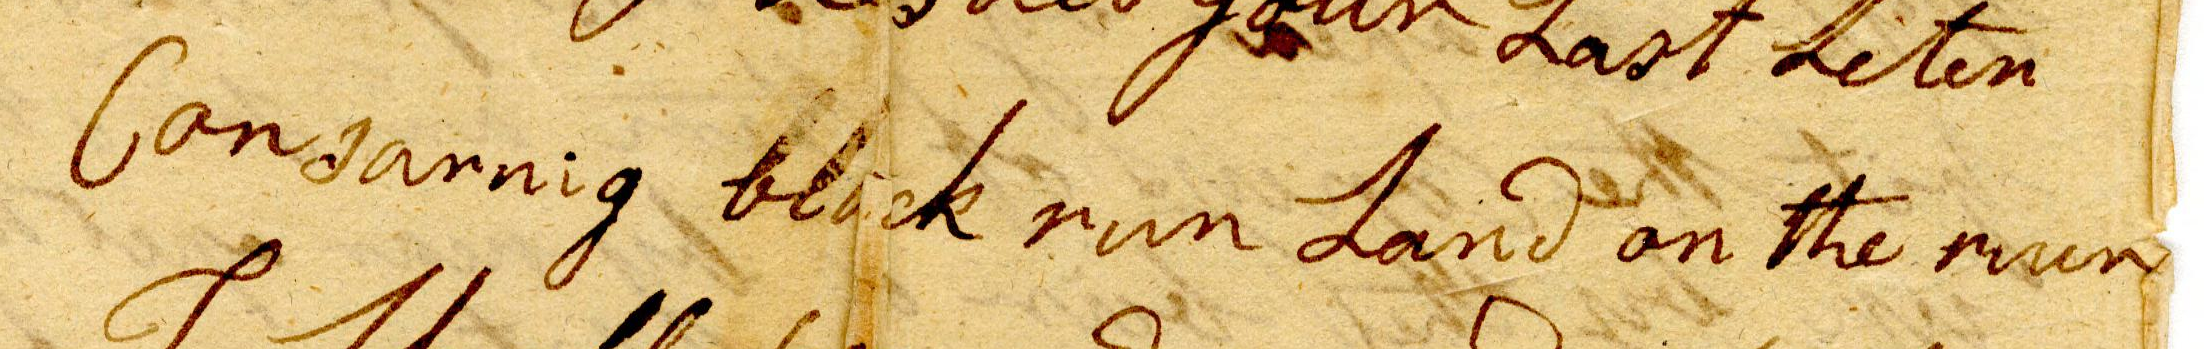Consarning black rum Land on the run
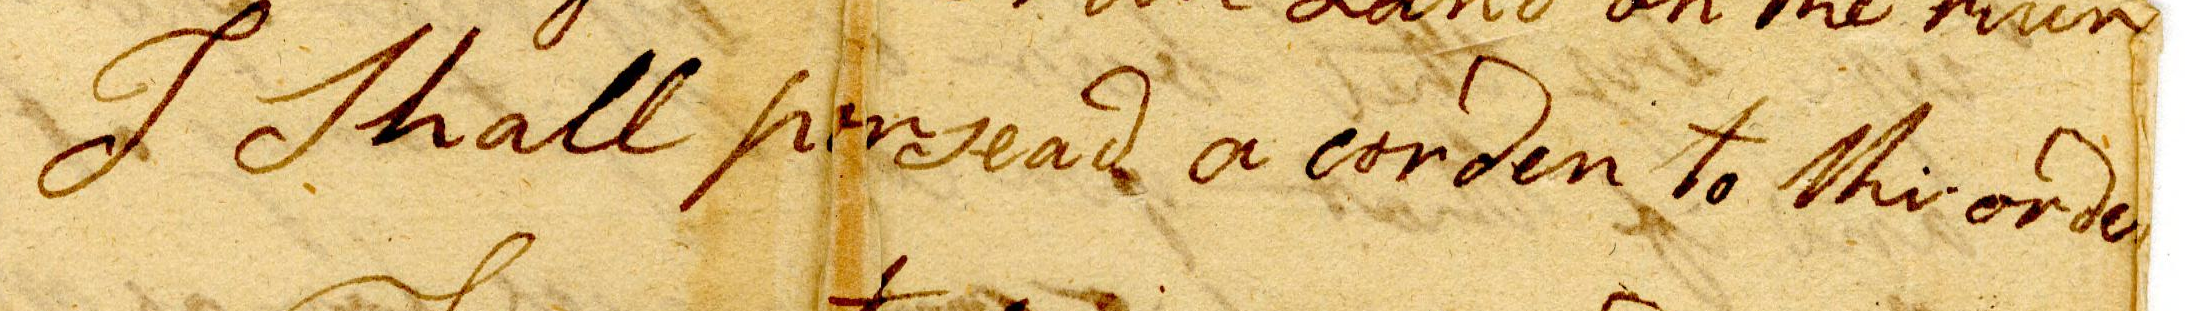I shall persead a corden to thir order
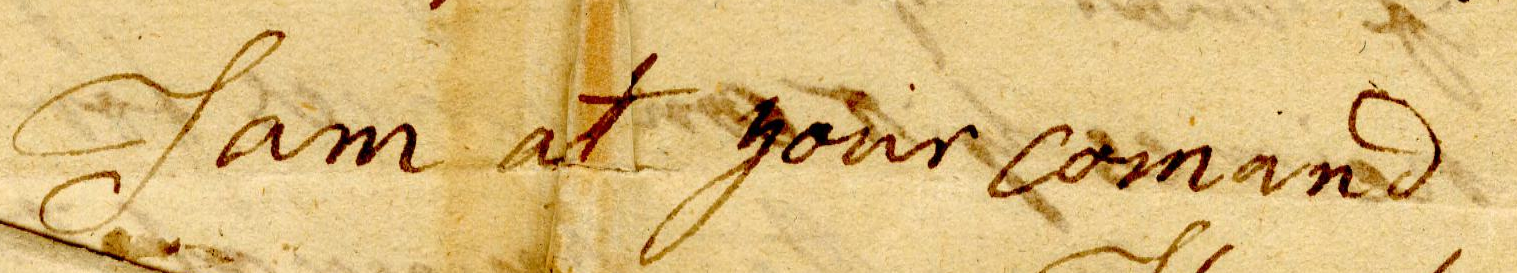I am at your comand
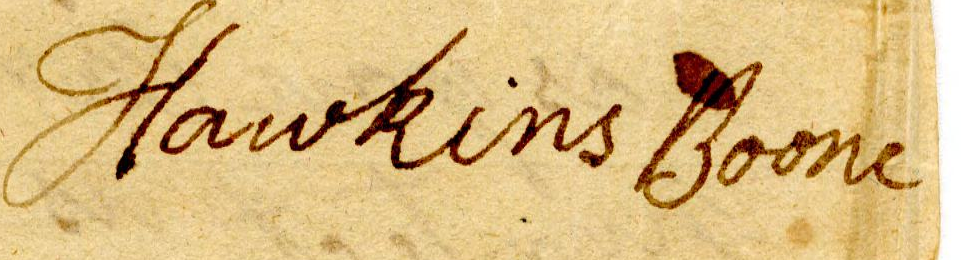Hawkins Boone
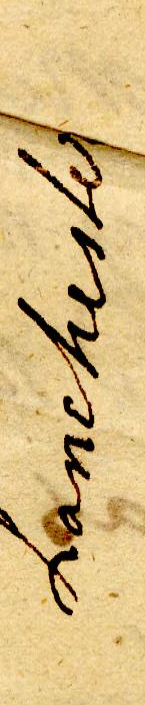Lanchester
